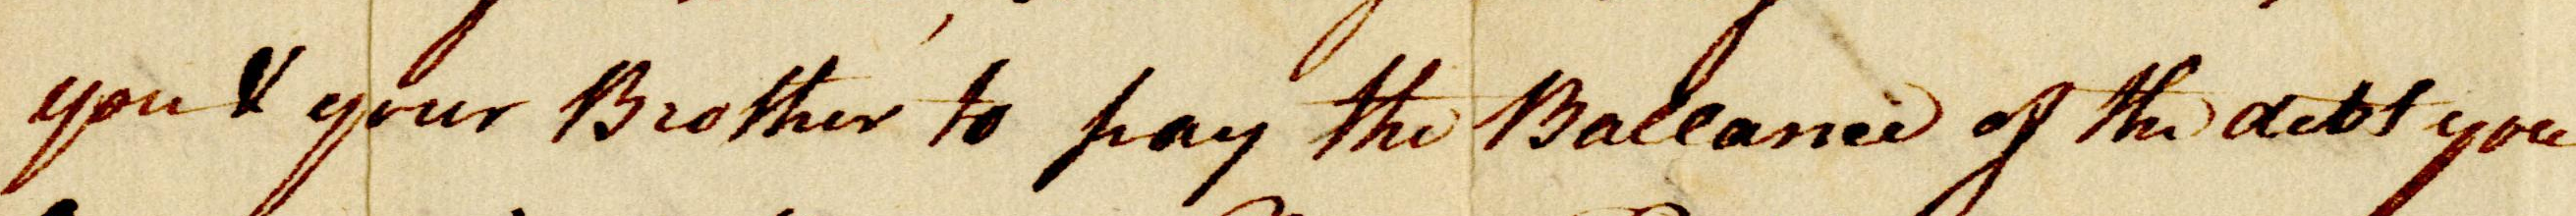you & your Brother to pay the Balance of the debt you
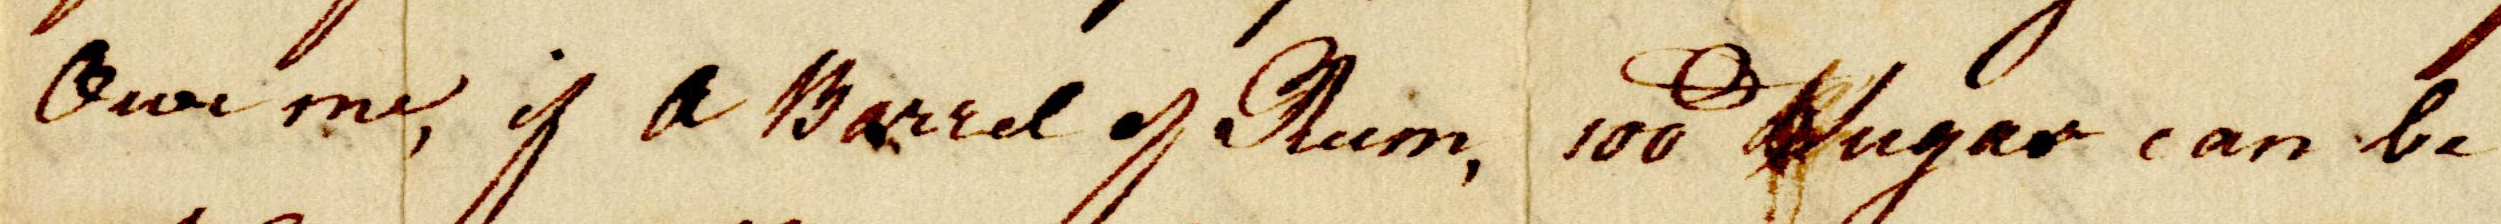Give me, if a Barrel of Rum, 100^lb Sugar can be
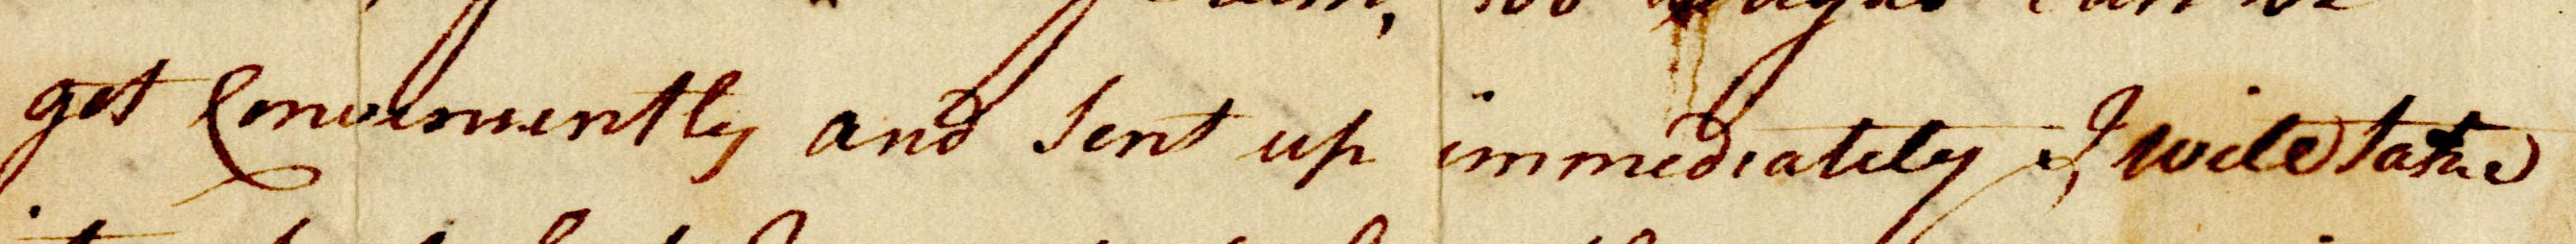got currently and Sent up immediately I will take
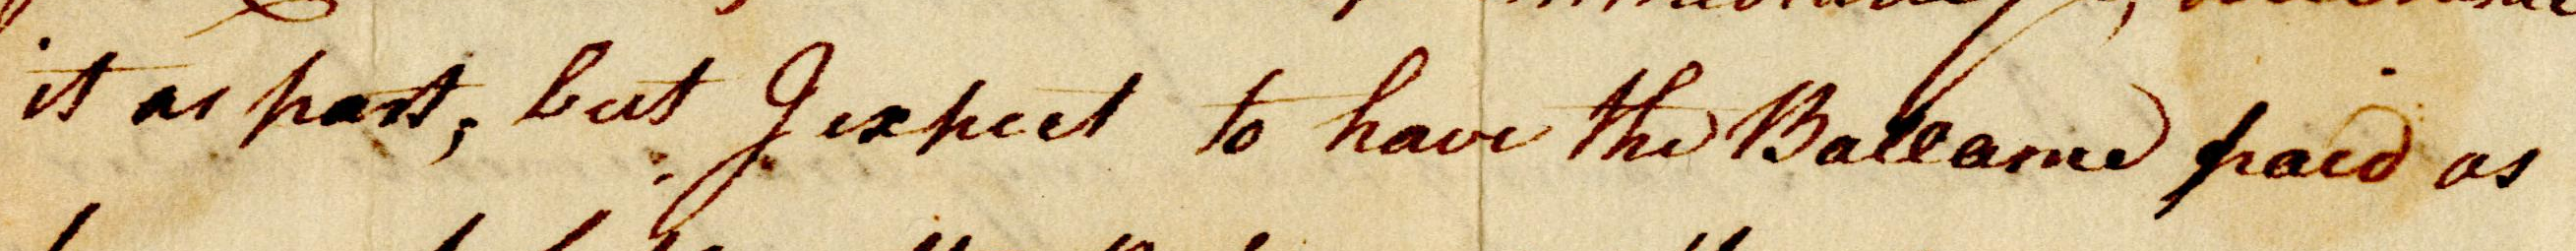it as part, but I expect to have the Balance paid as
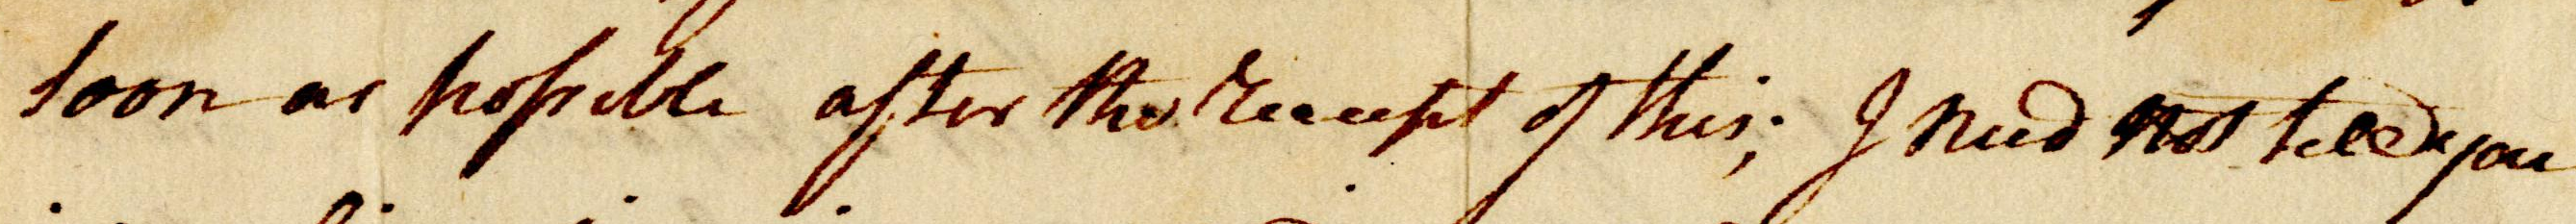soon as possible after the receipt of this; I need not tell you
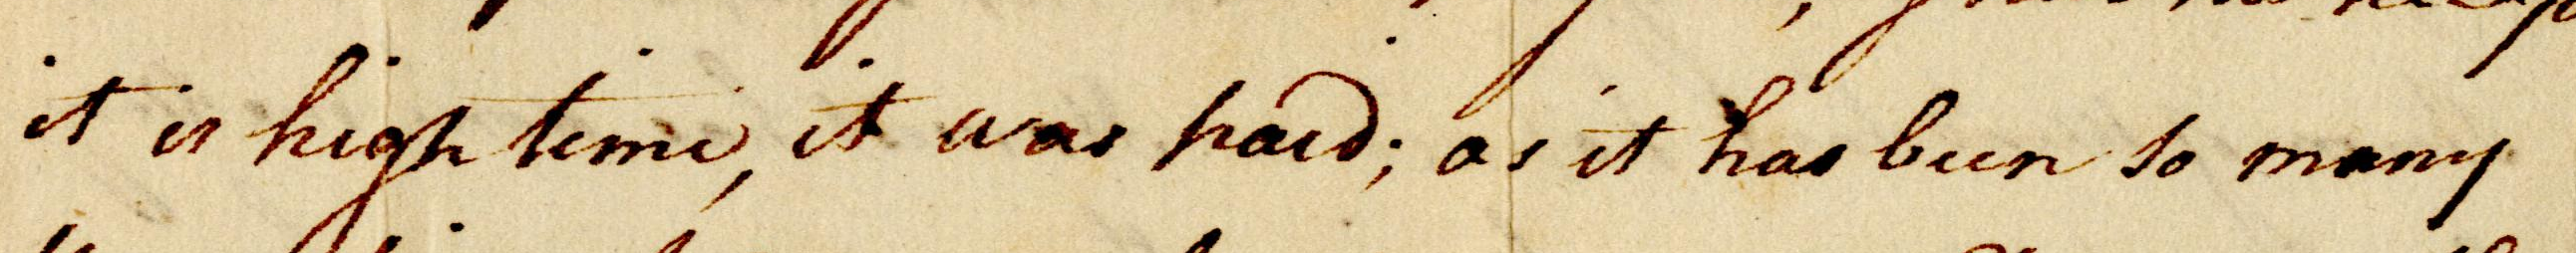it is high time, it was paid, as it has been so many
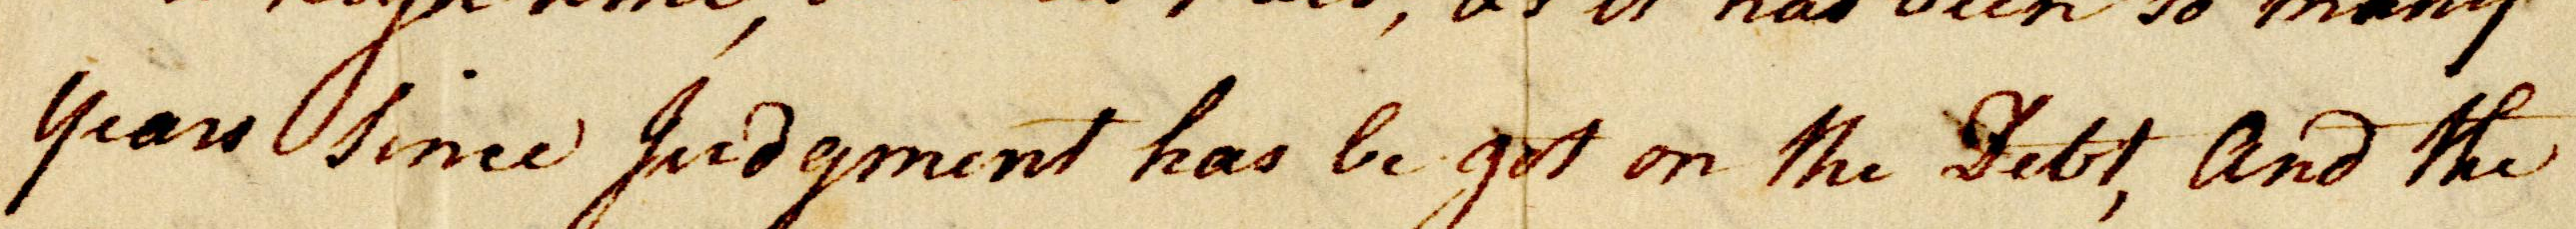years since judgment has be got on the Debt And the
